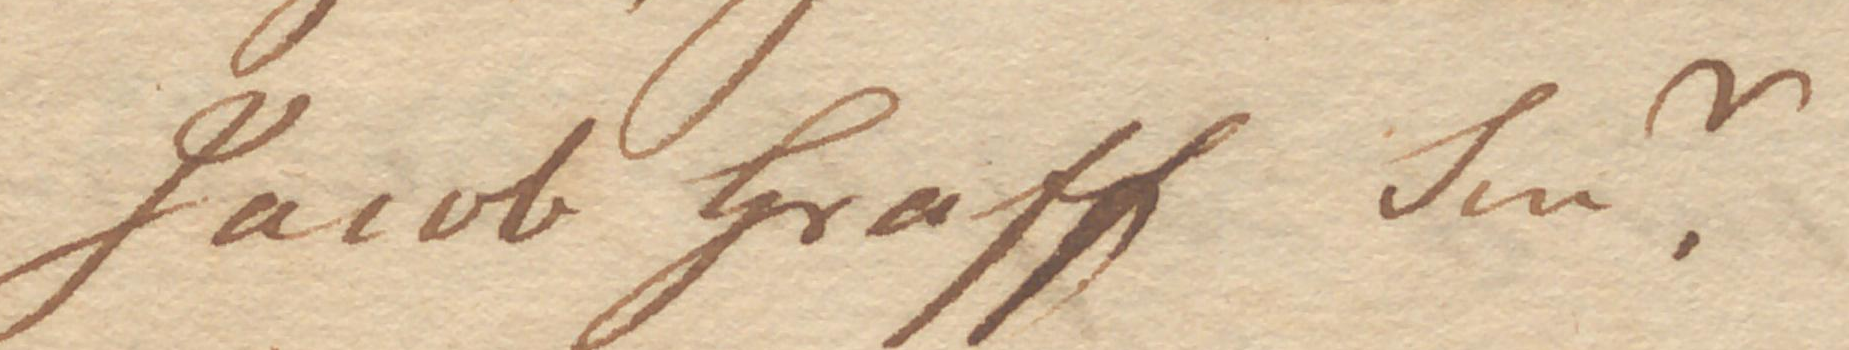Jacob Graff Sen^r.
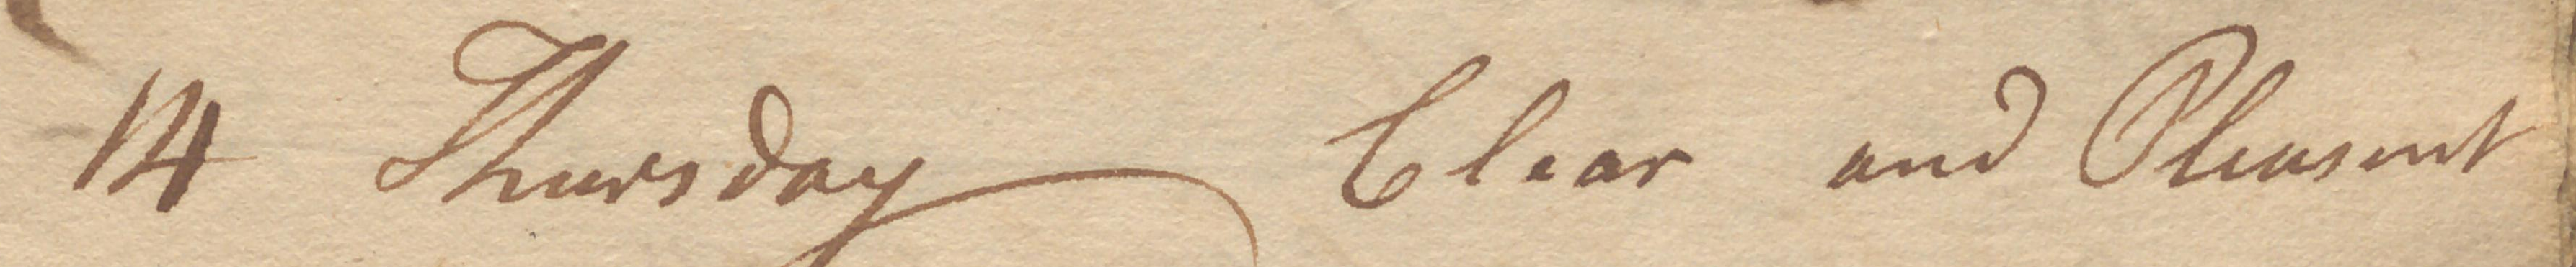14 Thursday- Clear and Pleasent
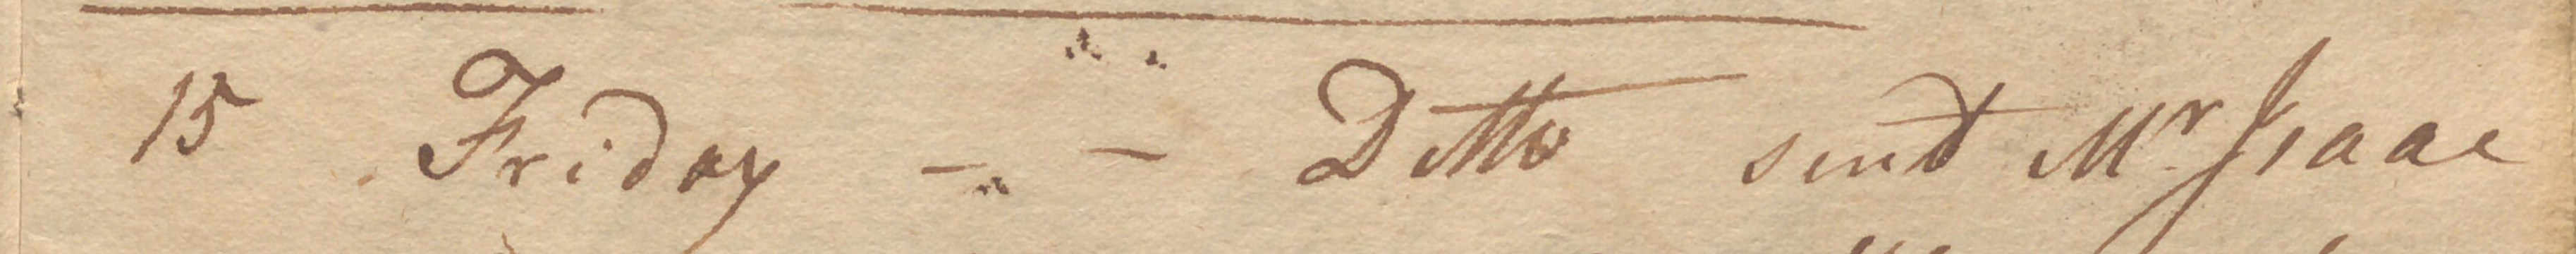15 Friday- Ditto sent M^r. Isaac
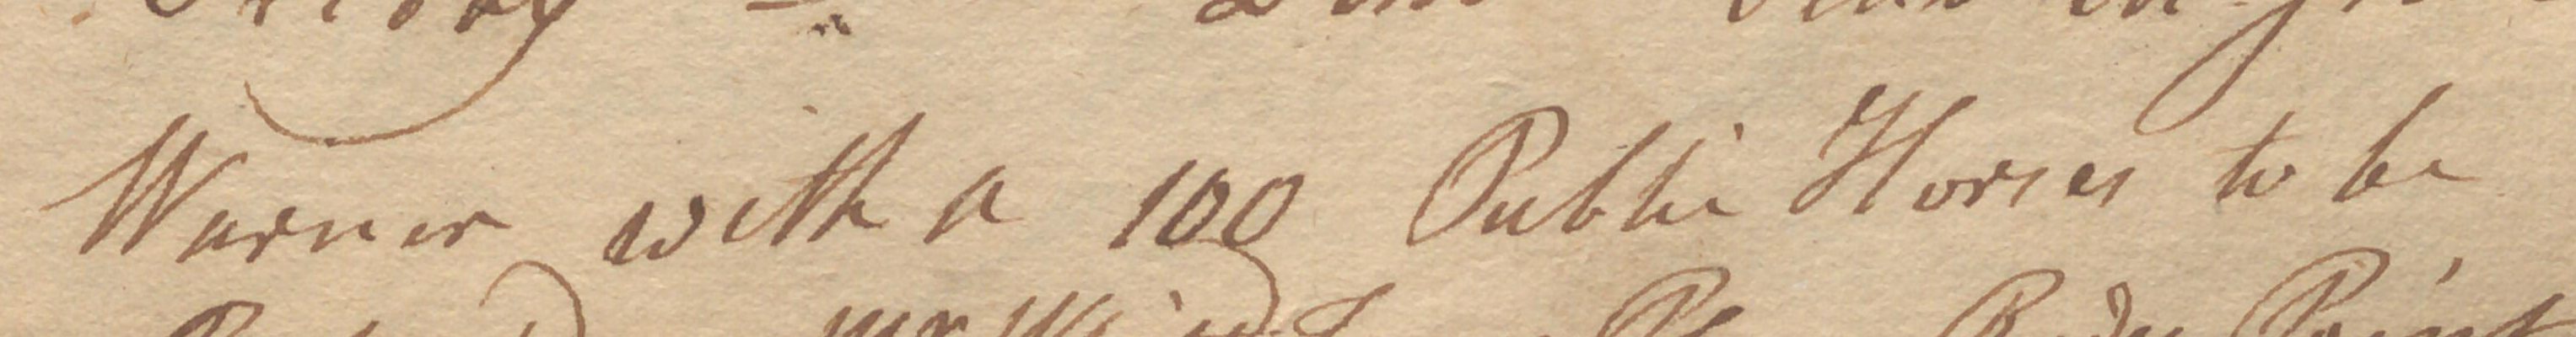Warner with a 100 Public Horses to be
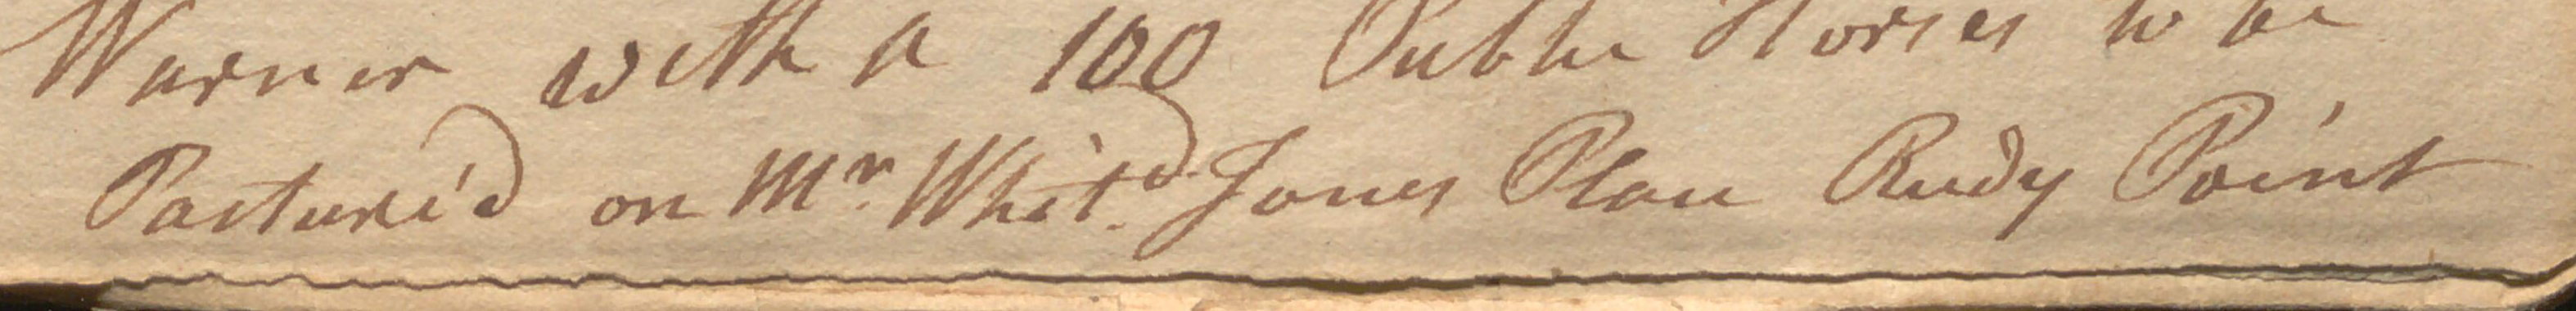Pasture'd on M^r. Whit^d. Jones Place Reedy Point
